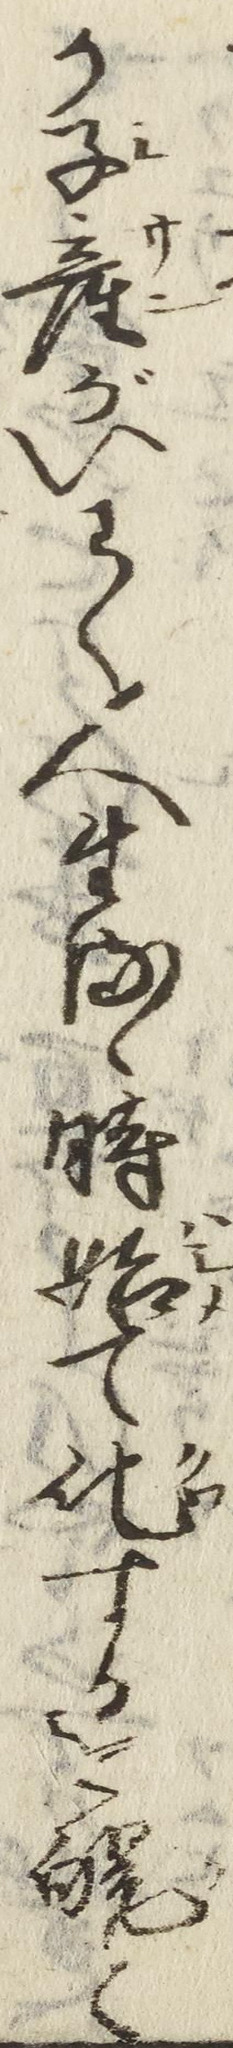か子産がいわく人生るゝ時始て化するを魄と
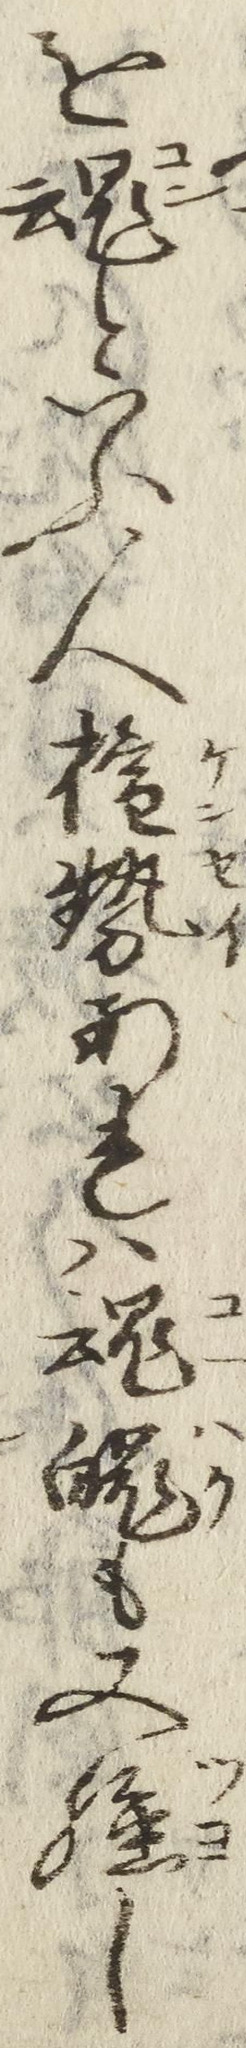を魂といふ人権勢あれは魂魄も又強し
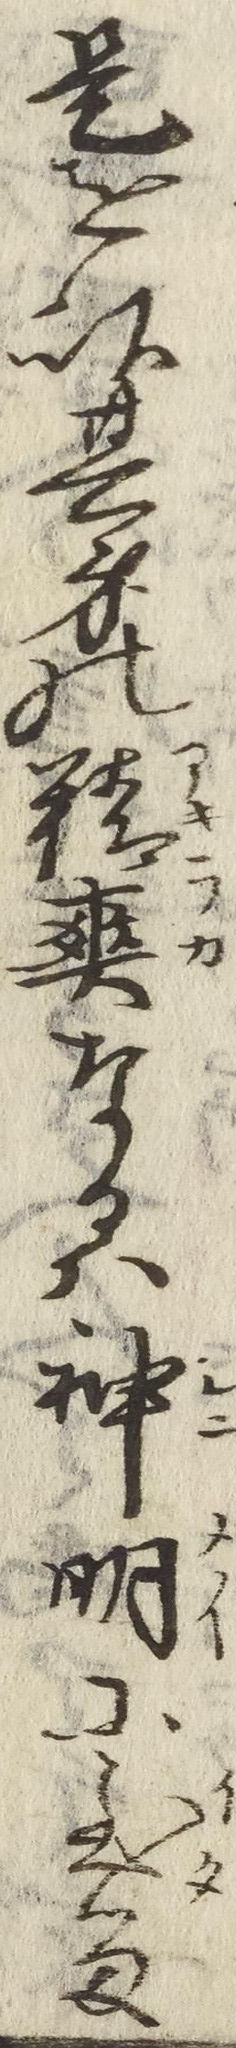是を以其身の精爽なるは神明に至る

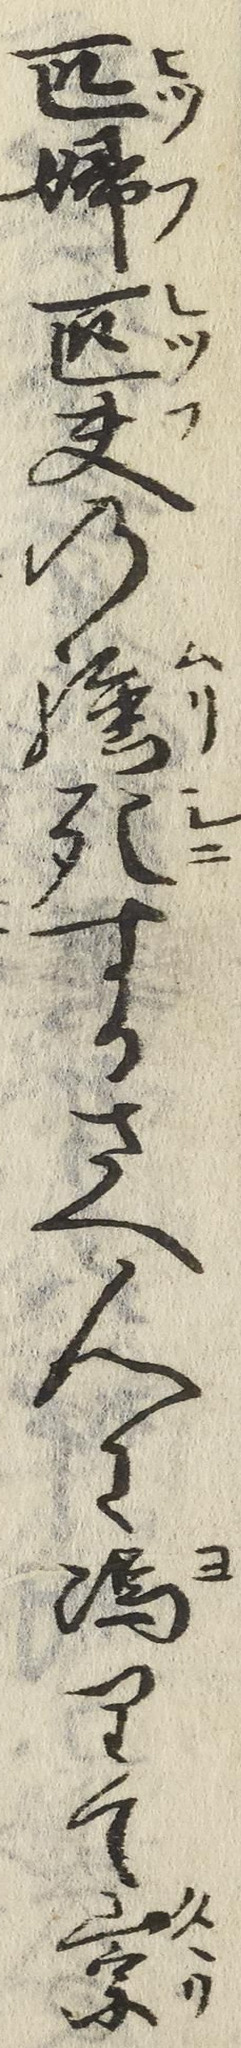匹婦匹夫の強死するさへ人に憑りて祟
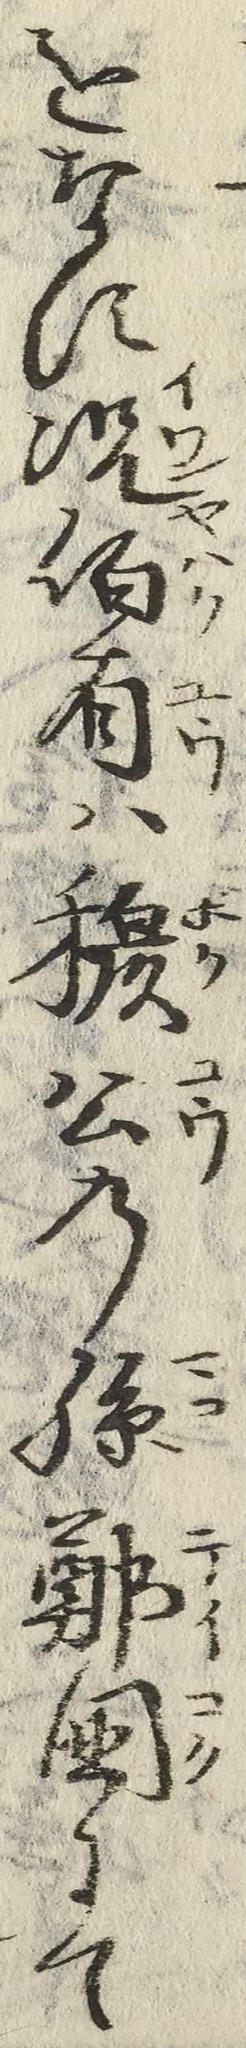をなす況伯有は穆公の孫鄭国にて
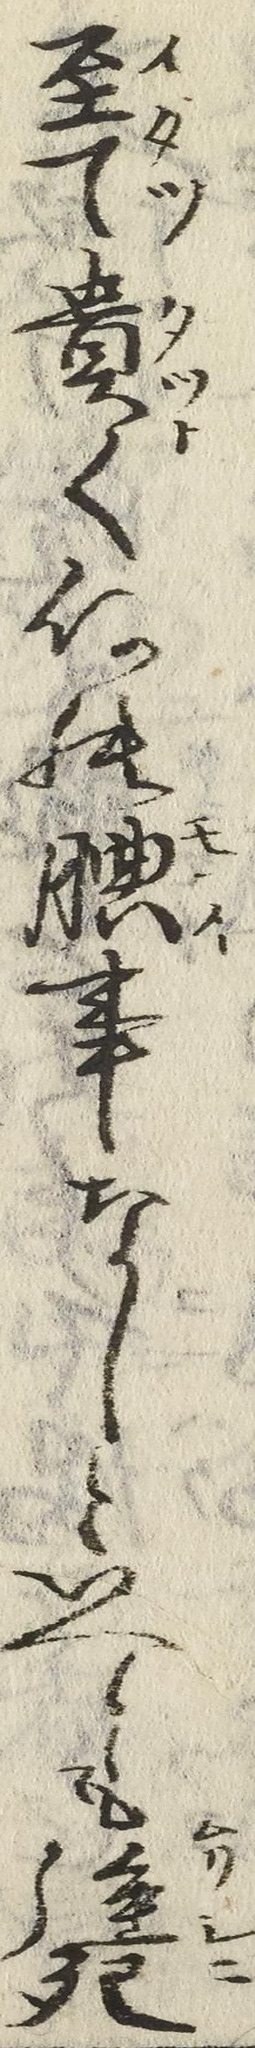至て貴く何の腆事なしといへとも強死
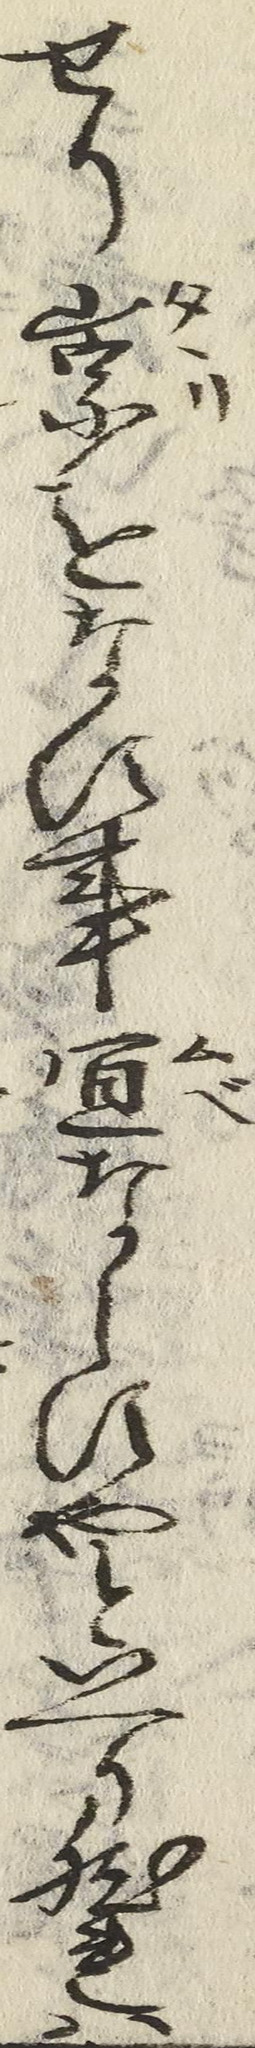せり祟をなす事宜ならすやといへり然れは
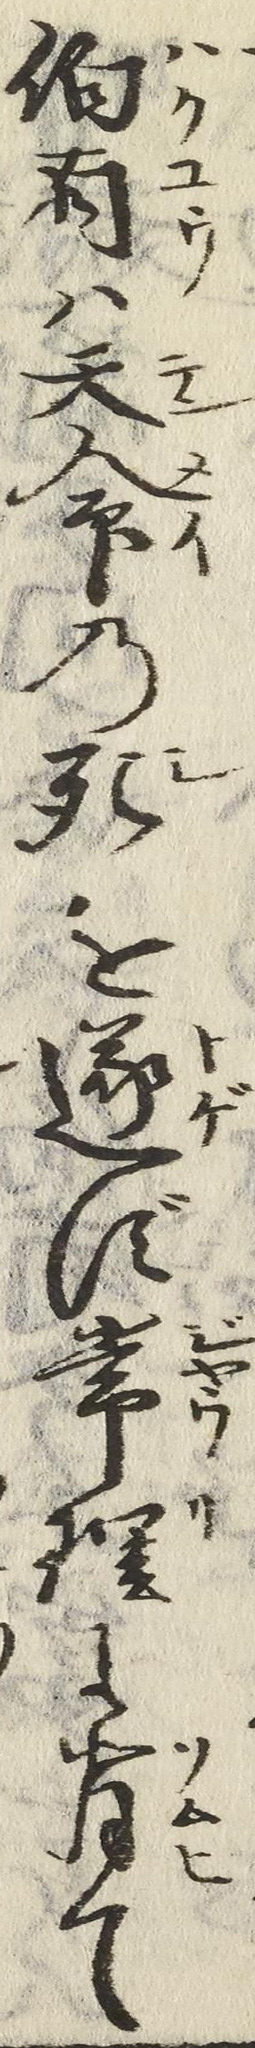伯有は天命の死を遂ず常理に背て
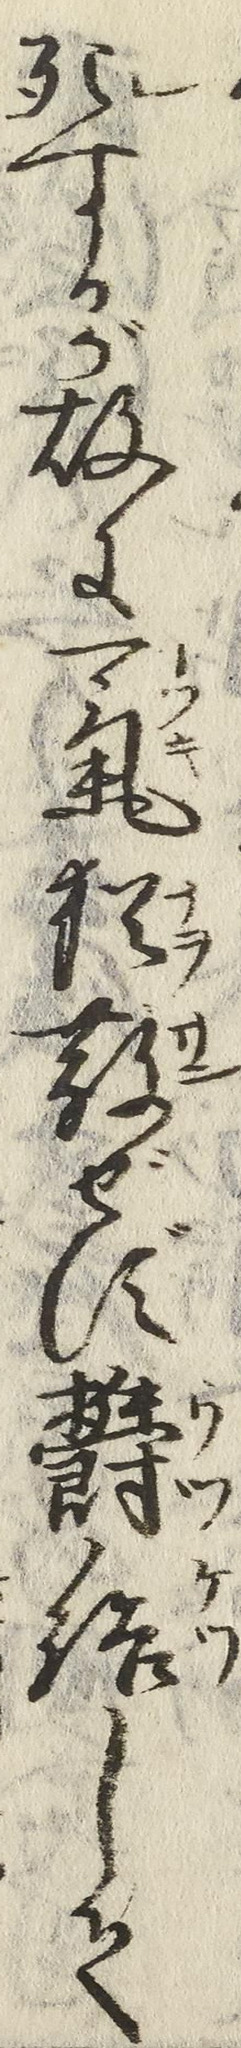死するが故に一気猶散ぜず鬱結して
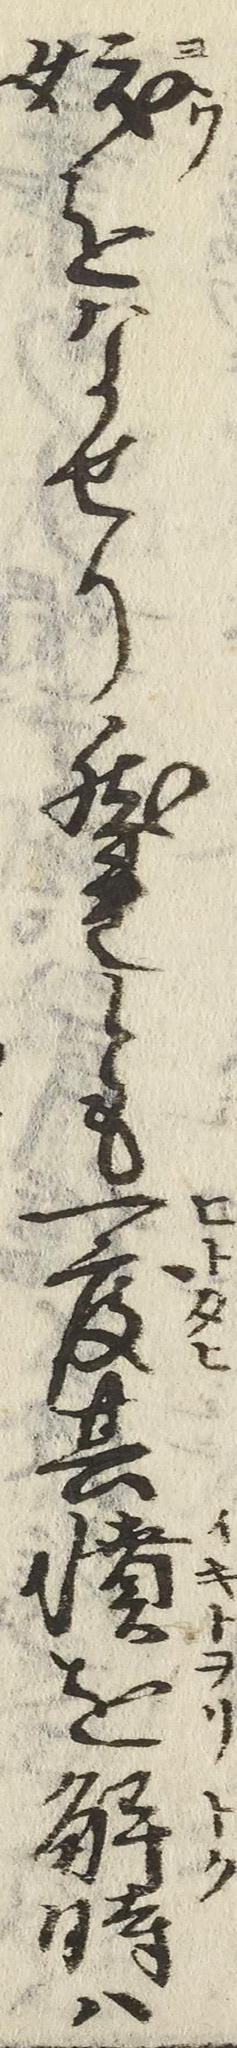妖をなせり然れとも一度其憤を解時は
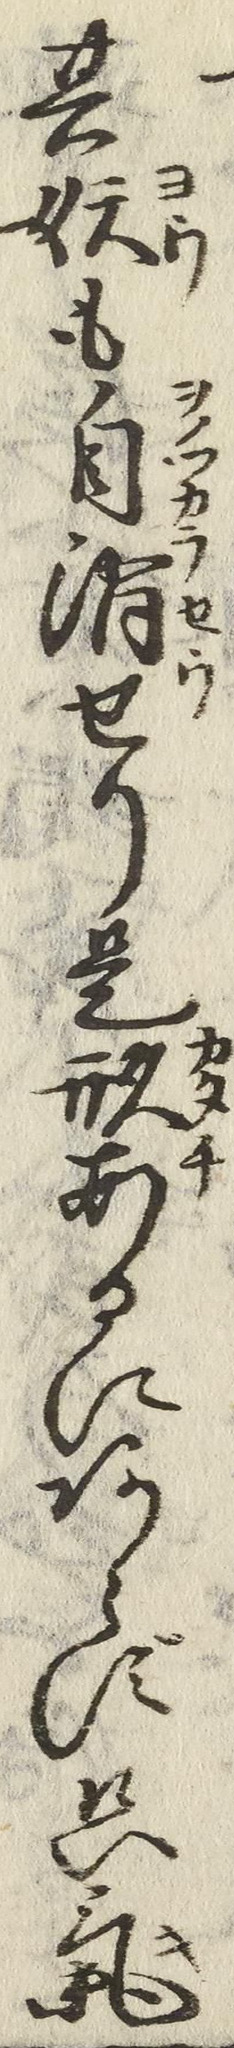其妖も自消せり是形あるにあらず只気
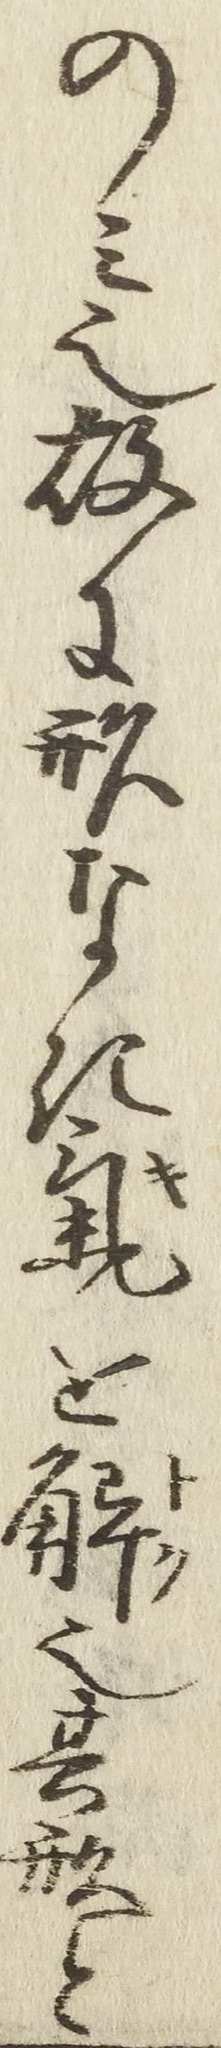のみ也故に形なき気を解也其形と
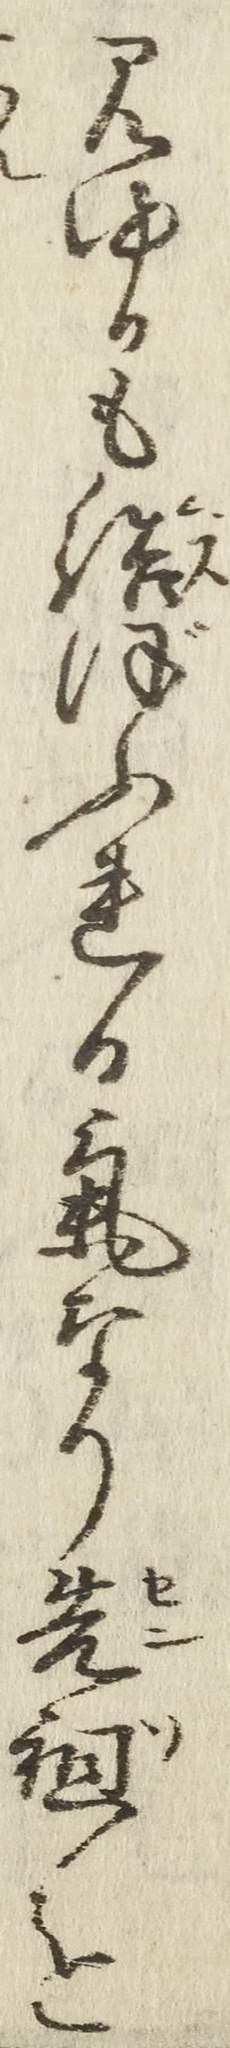見ゆるも結ぼふれる気なり先祖を
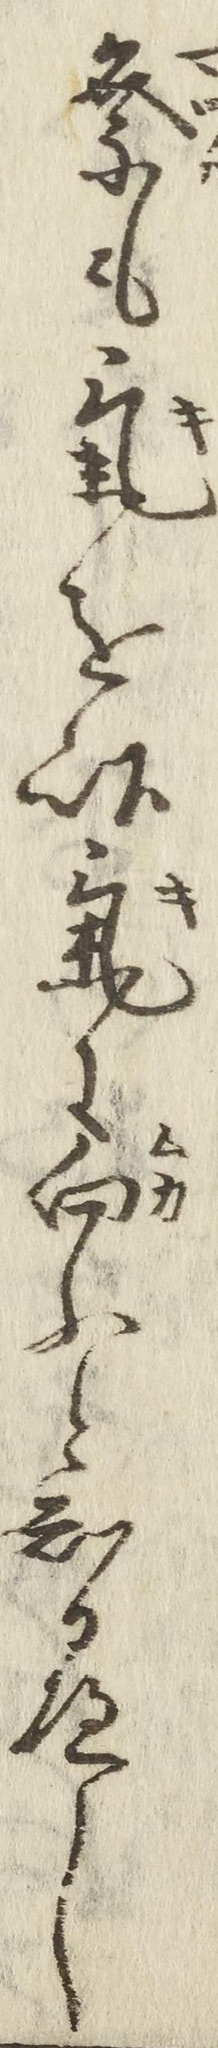祭も気を以気に向ふと知るへし
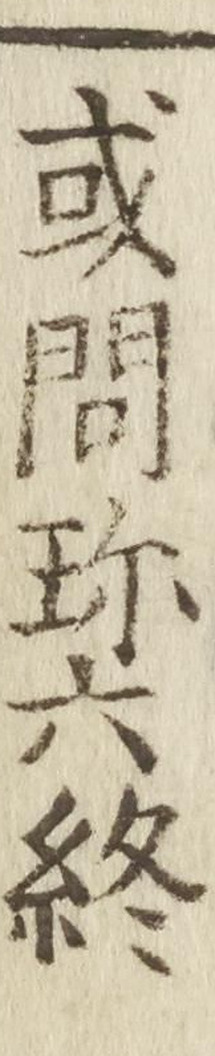或問珍六終

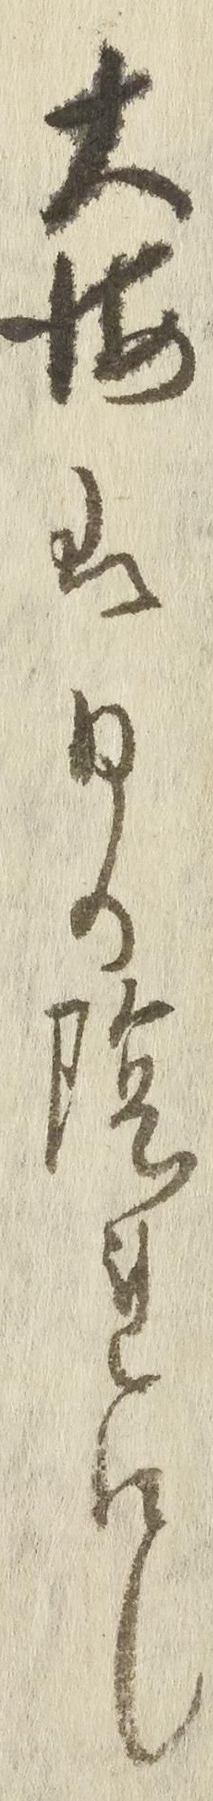大海は日の陰れ？けし
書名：天地或問珍　地
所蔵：東京大学地震研究所図書室 Earthquake Research Institute Library, The University of Tokyo, JAPAN
